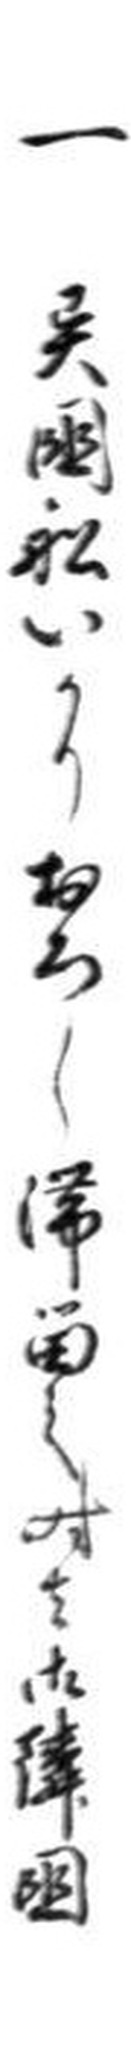一異国船いかりおろし滞留之時者御隣国
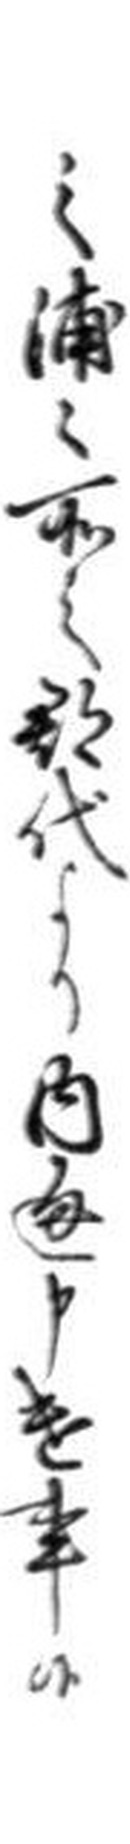之浦々所之郡代より内通申遣事候
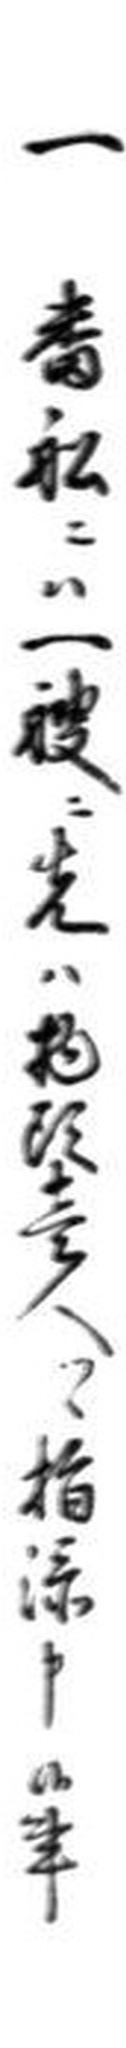一番船ニハ一艘ニ先ハ物頭壱人ツヽ指添申候事
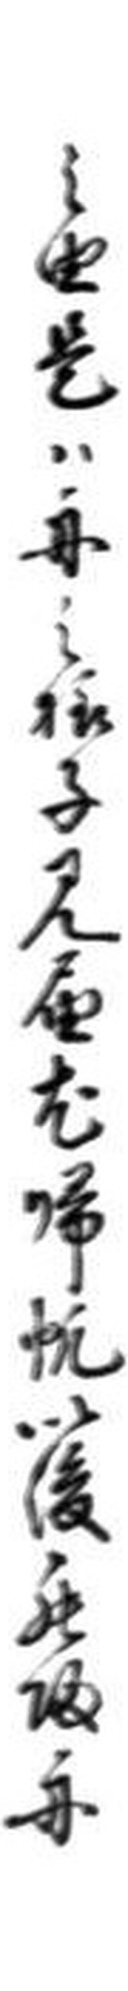之由是ハ舟之様子見届尤帰帆以後罷帰舟
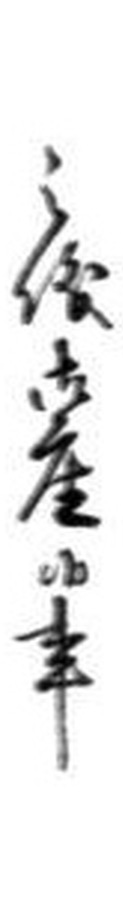之儀御座候事
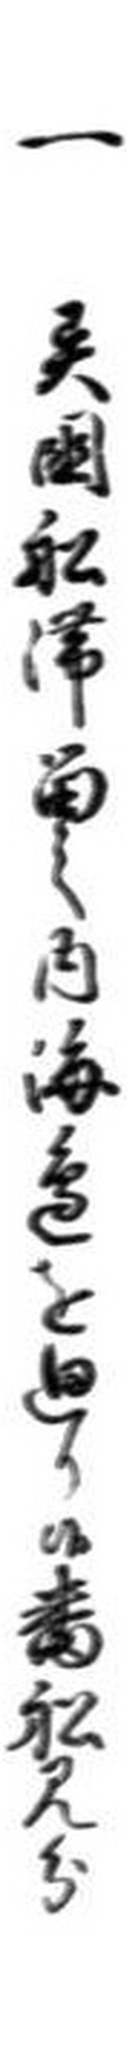一異国船滞留之内海辺を廻り候番船見分
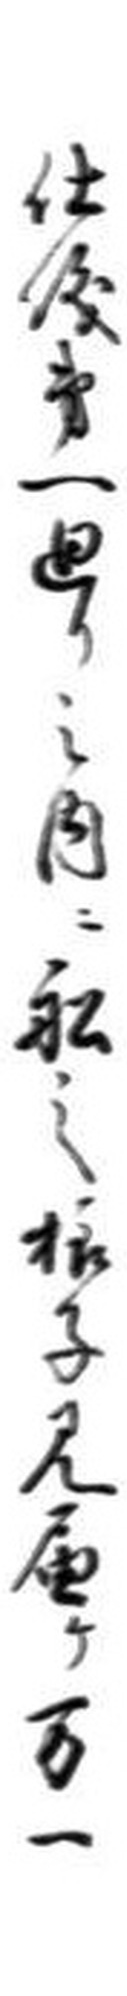仕儀第一廻り之内ニ船之様子見届ケ万一
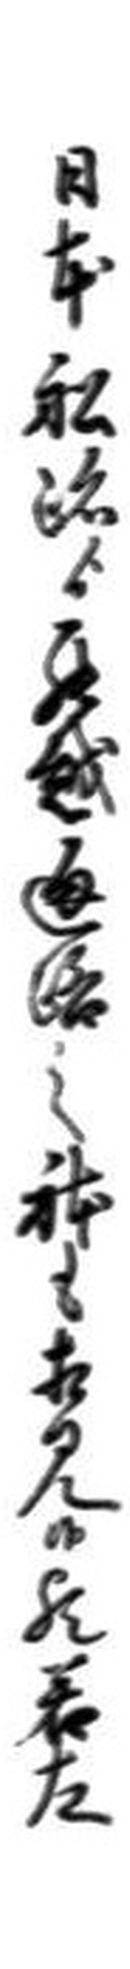日本船跡ゟ罷越通路之体も相見候歟若左
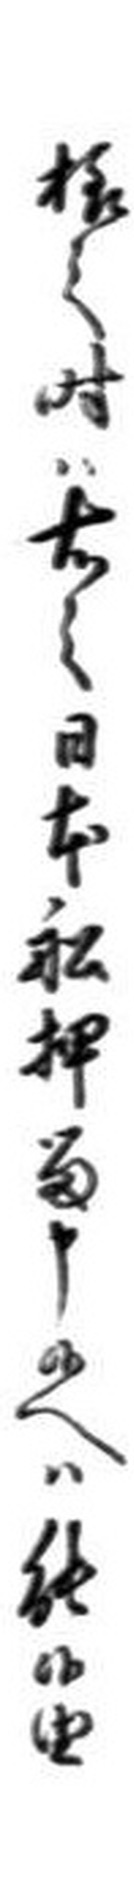様之時ハ右之日本船押留申候ヘハ能候由
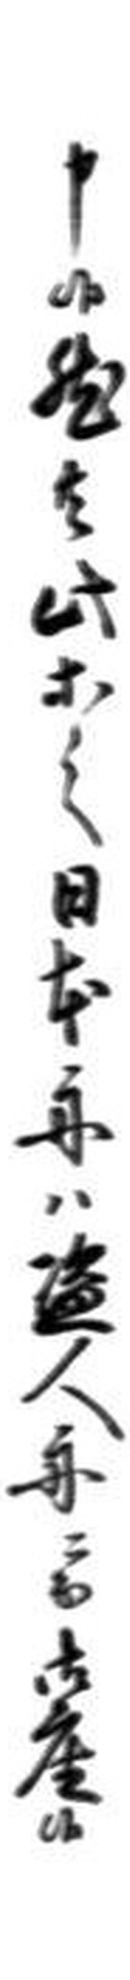申候然共此等之日本舟ハ盗人舟ニ而御座候
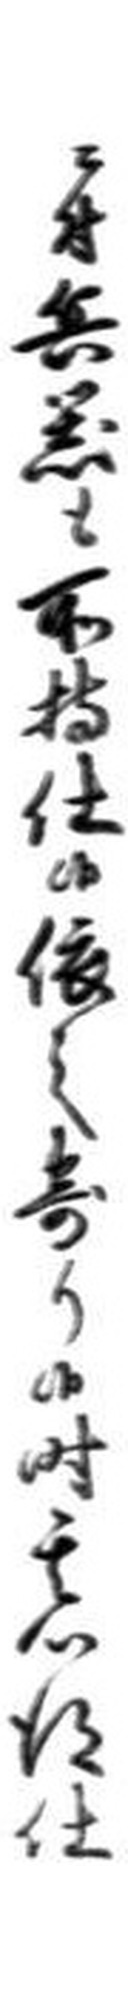ニ付兵器も所持仕候依之寄り候時其心得仕
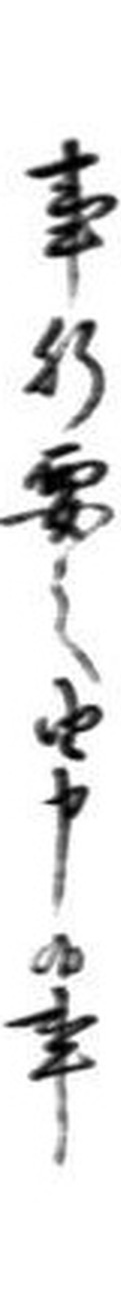事肝要之由申候事

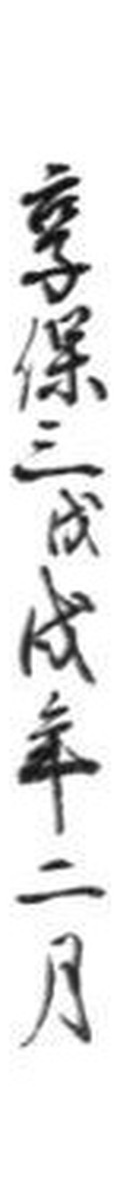享保三戊戌年二月
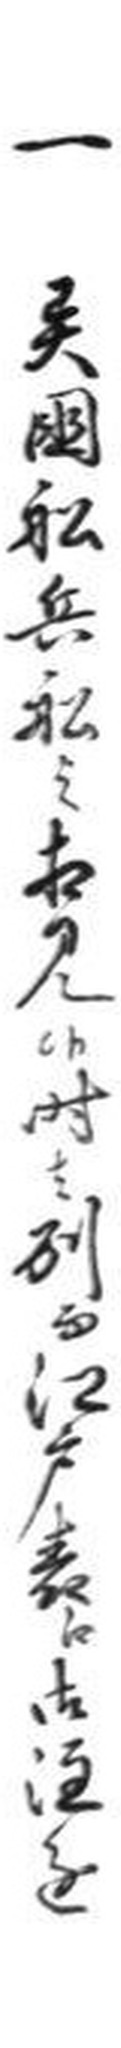一異国船兵船与相見候時者別而江戸表江御注進
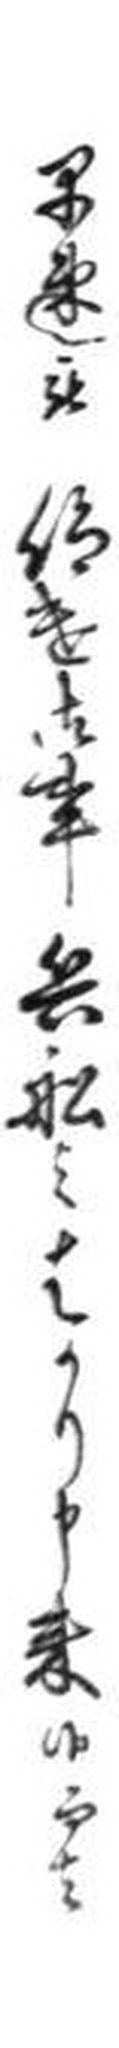早速被仰遣御事兵船与はかり申来候而者
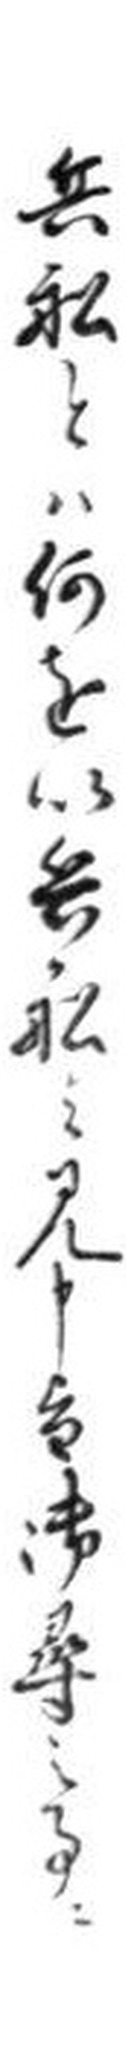兵船とハ何を以兵船与見申旨御尋之事ニ
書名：家譜 三十二 吉邦公 従享保二年到享保三年
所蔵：福井県文書館 Fukui Prefectural Archives
